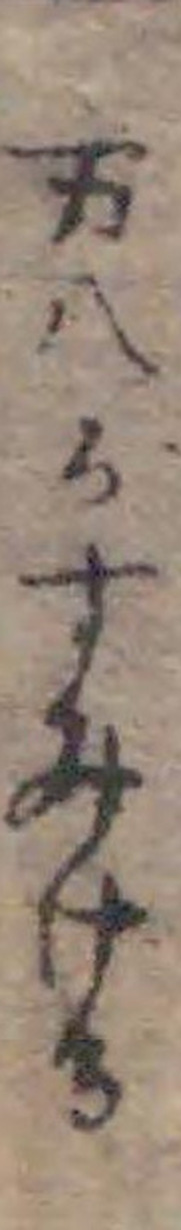万八かすみける
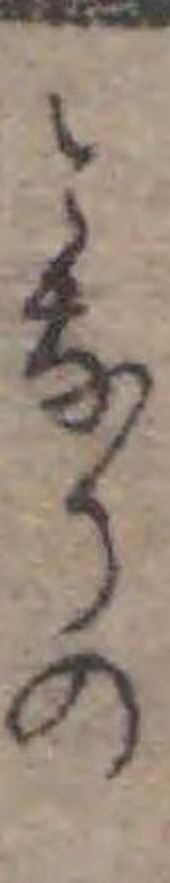となりの
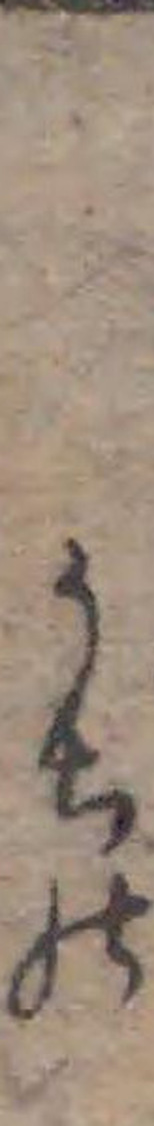うちの
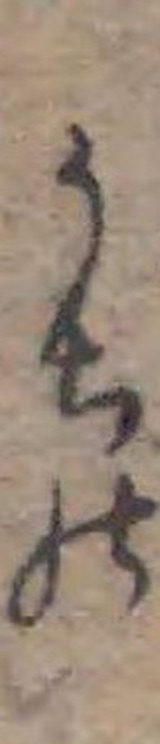うちの
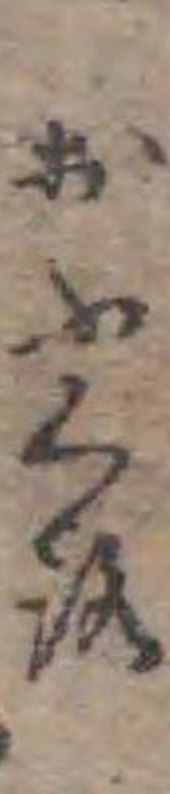おふくろ
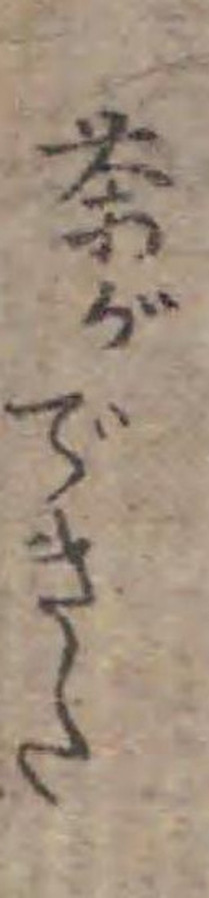茶ができた
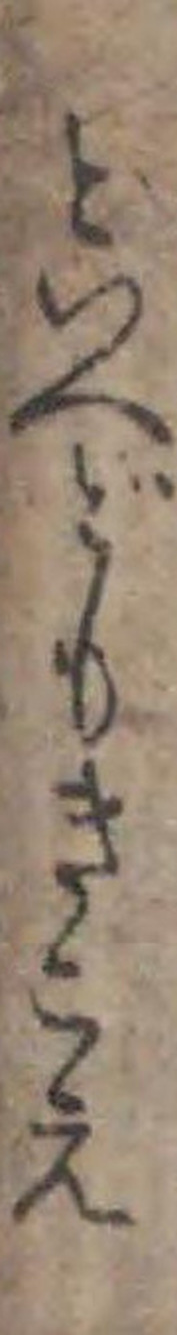といへどもきこえ
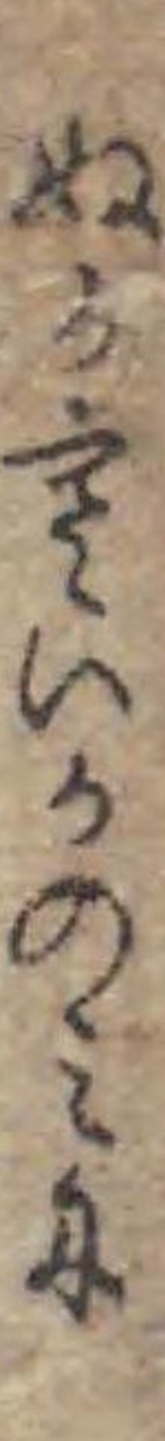ぬか寒いかのみに
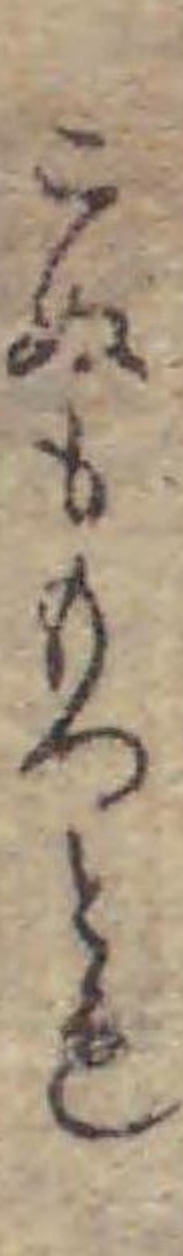こぬももつとも
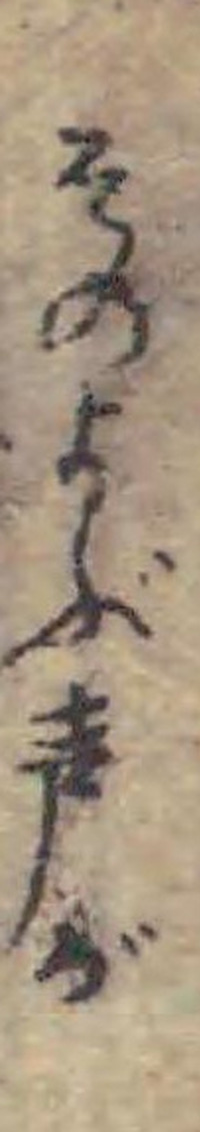そのよぶ声が
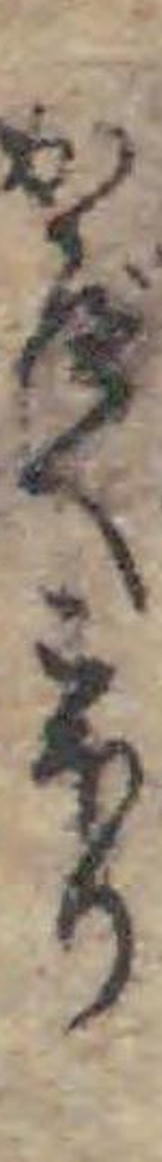かべへこほり
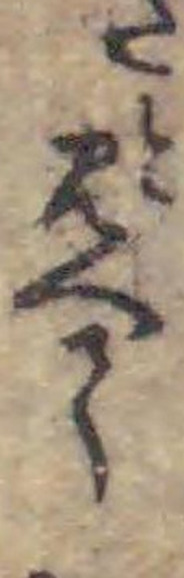見へて
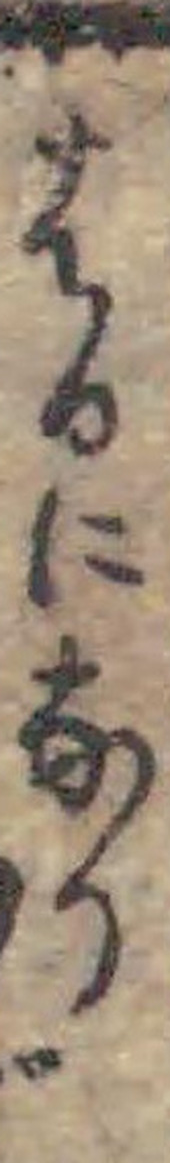はるになり
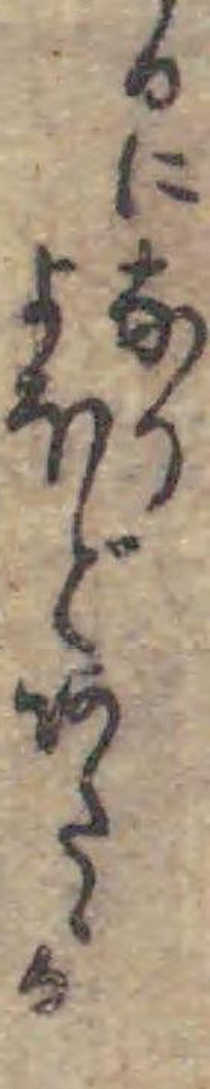よほどあたゝか
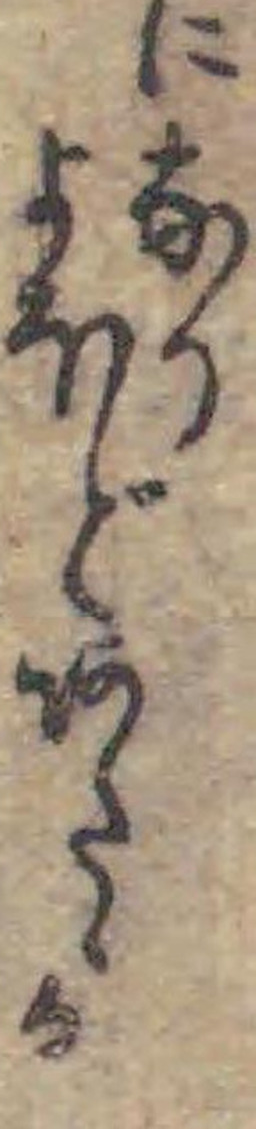よほどあたゝか
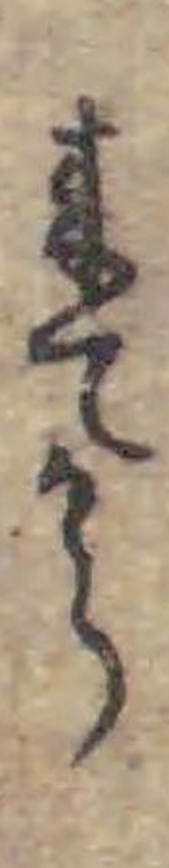来てから
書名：虚言八百万八伝 : 3巻
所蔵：国立国会図書館 National Diet Library, JAPAN
